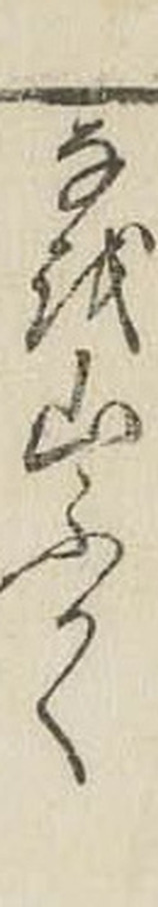なを山ふかく
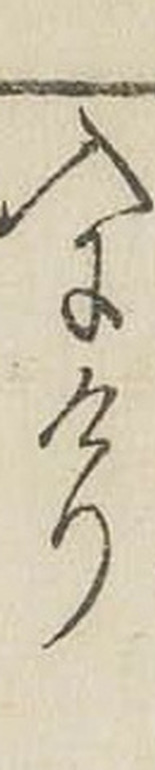入にけり

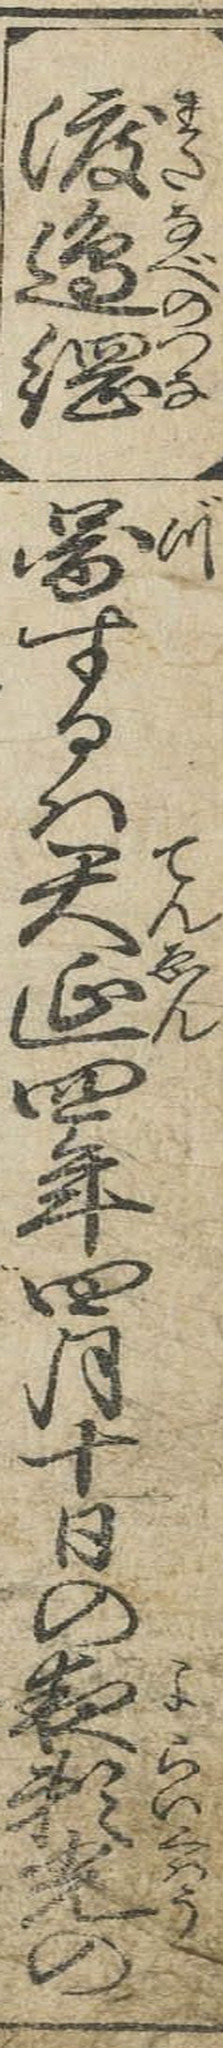渡辺綱図するは天延四年四月十日の夜頼光の
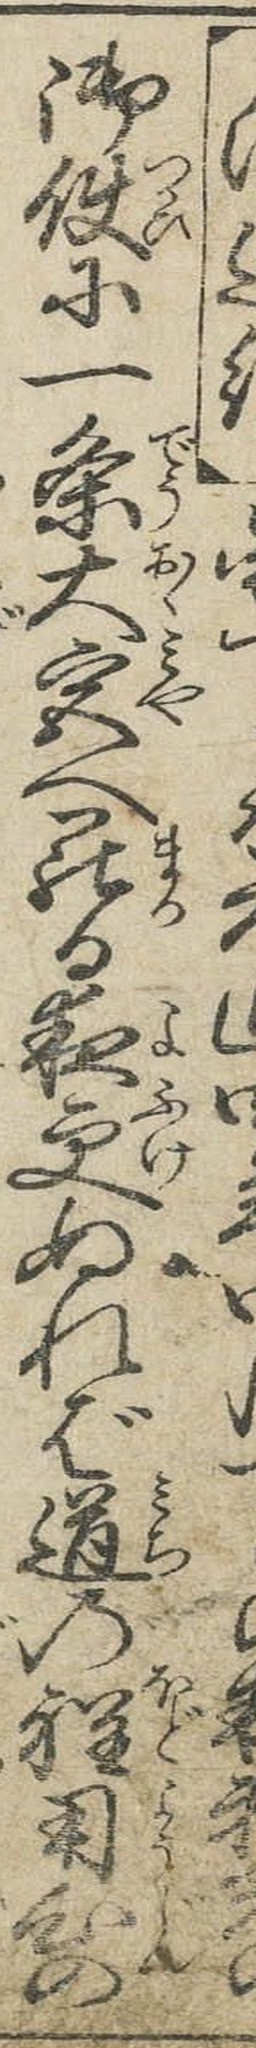御使に一条大宮へ罷る夜更ぬれば道の程用心の
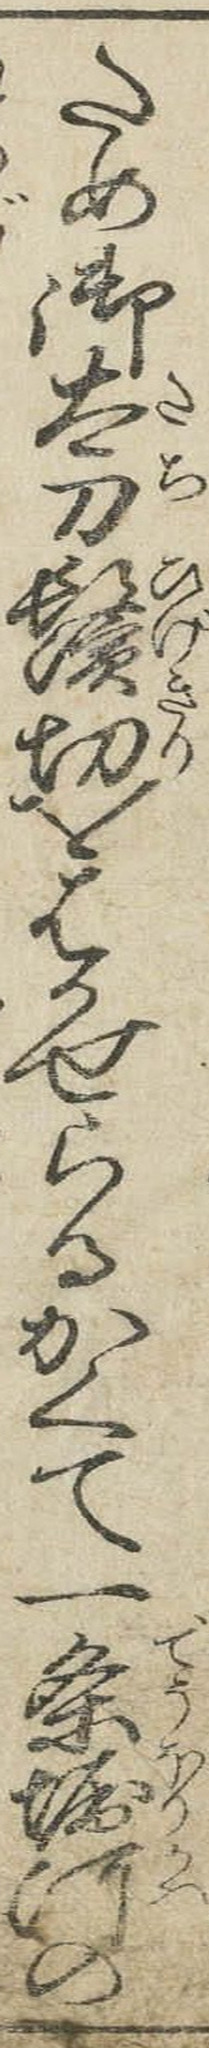ため御太刀鬚切をはかせらるかくて一条堀河の
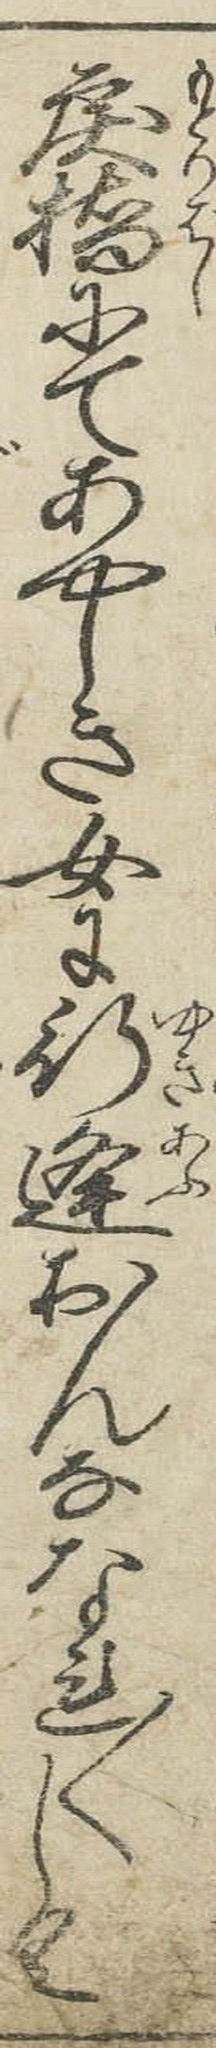戻橋にてあやしき女に行逢おんななれ〳〵しく
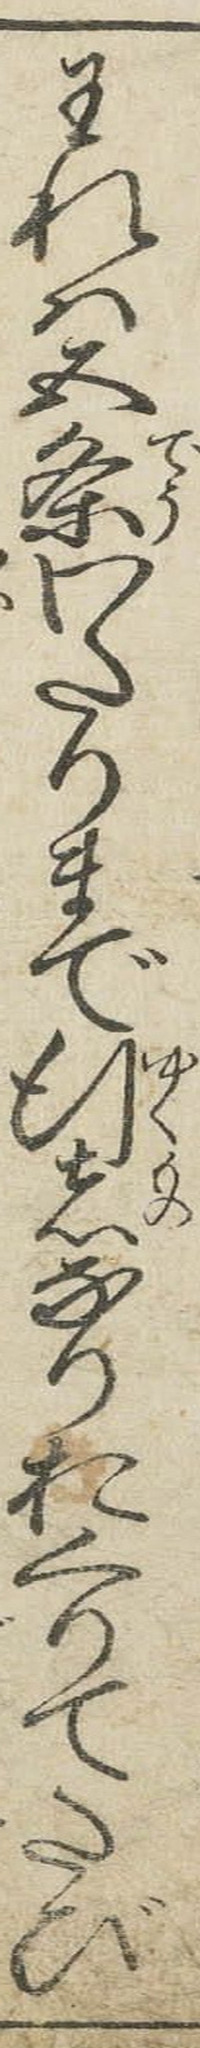われは五条わたりまで行者なりおくりてたび
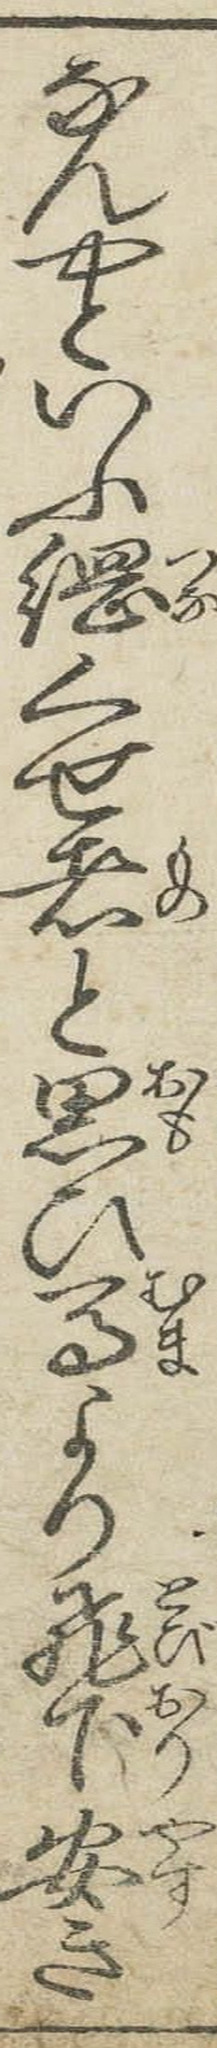なんやといふ綱くせ者と思ひ馬より飛下安き
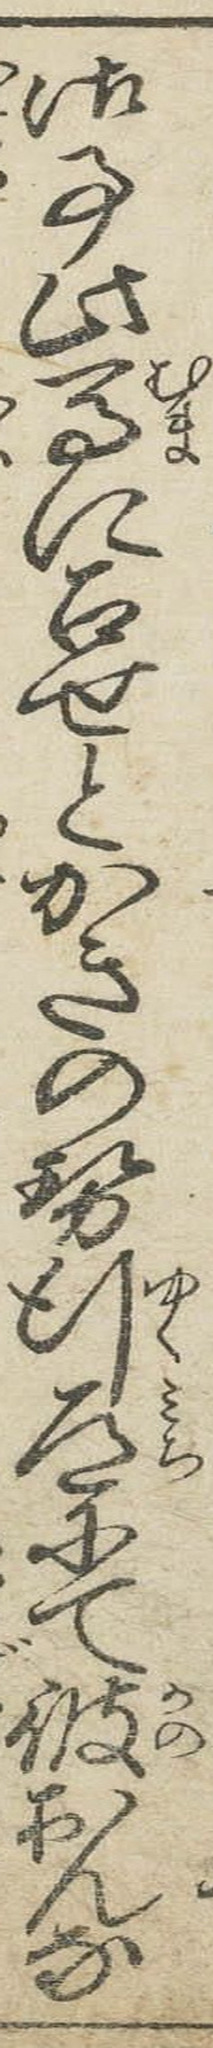御事此馬に召せとかきのせ行道にて彼おんな
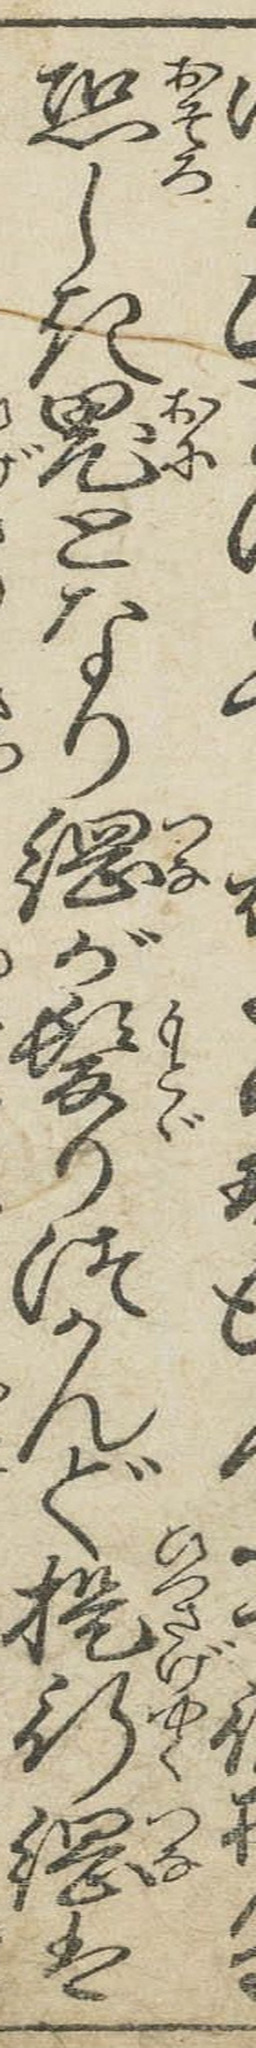恐しき鬼となり綱が髪りつかんで提行綱は
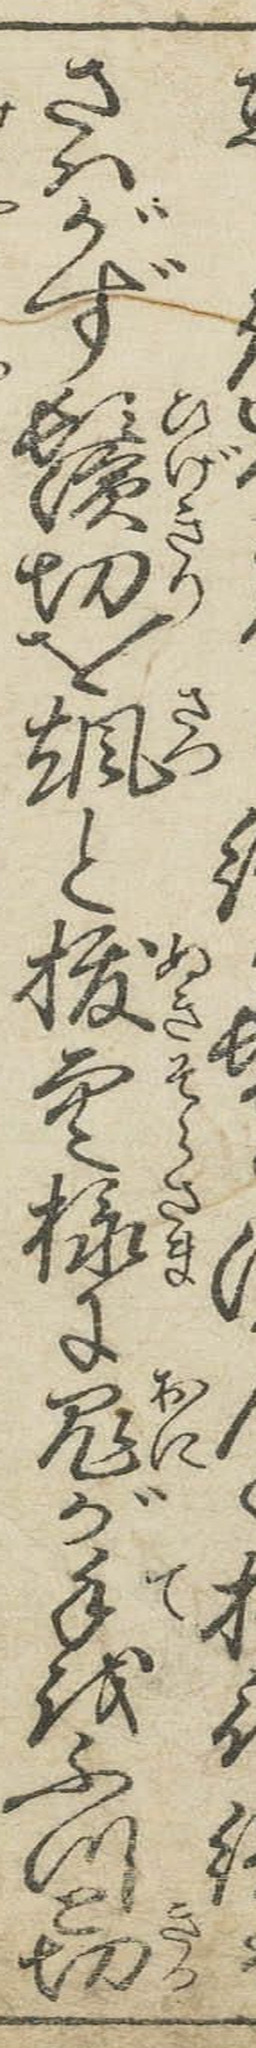さはがず鬚切を颯と抜空様に鬼が手をふつと切
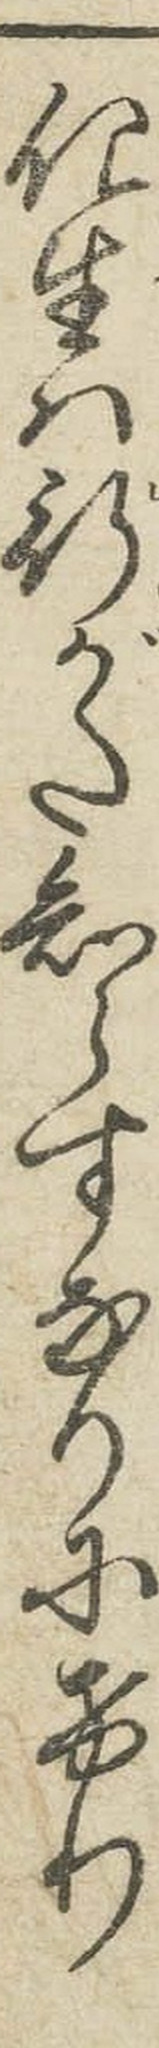化生は行がた知らずなりにけり
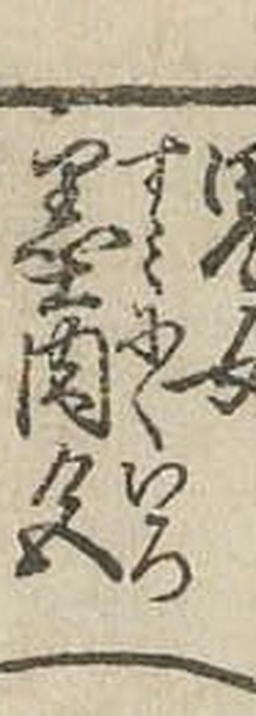墨肉色
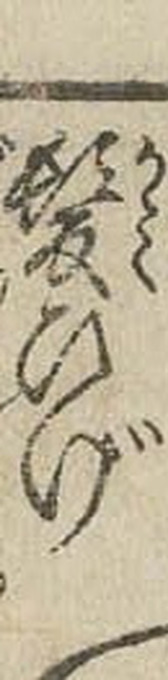髪ひげ
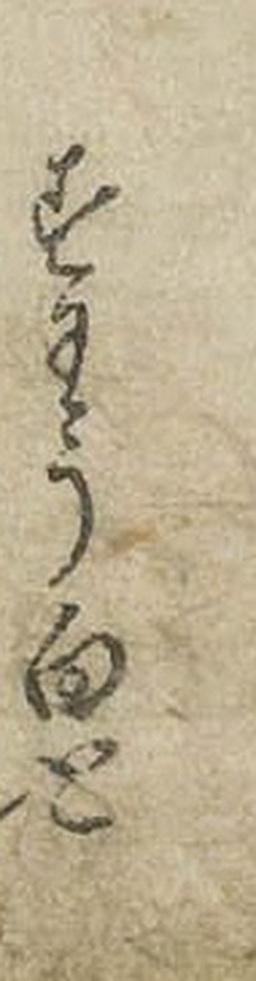すわう白と
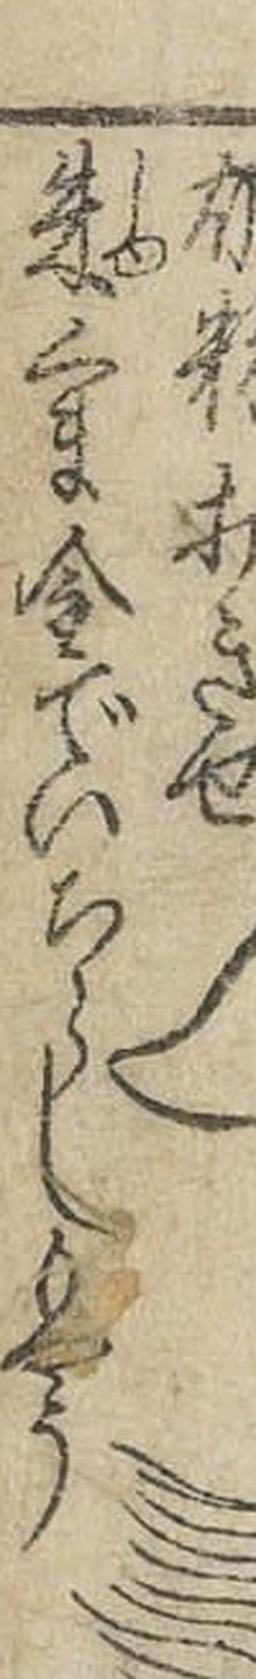朱くま金でいちらしもやう
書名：絵本写宝袋 9巻 2之巻
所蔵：東京学芸大学教育コンテンツアーカイブ
